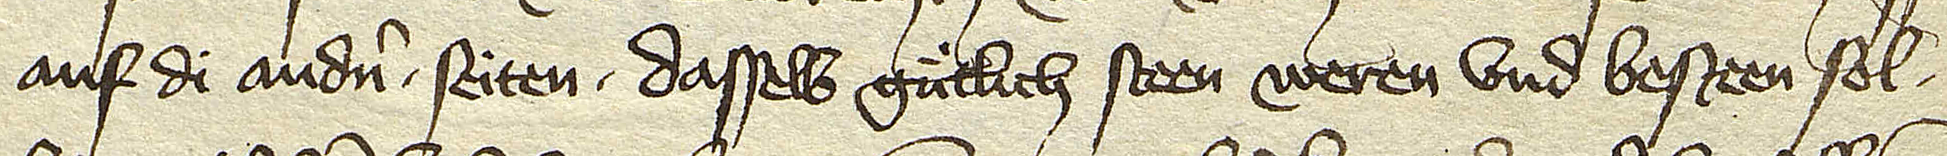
auf di andn* / ſeiten / Daſſelb gütlich ſteen weren vnd beſteen ſol
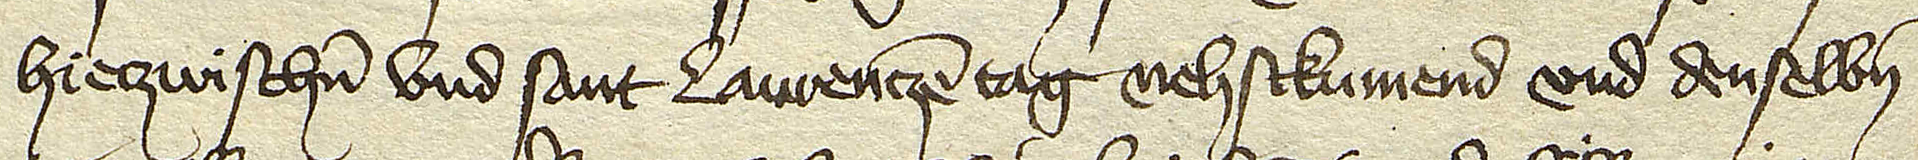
hiecʒwiſchn* vnd ſant Laurencʒe* tag nehſtkumend vnd denſelbn*
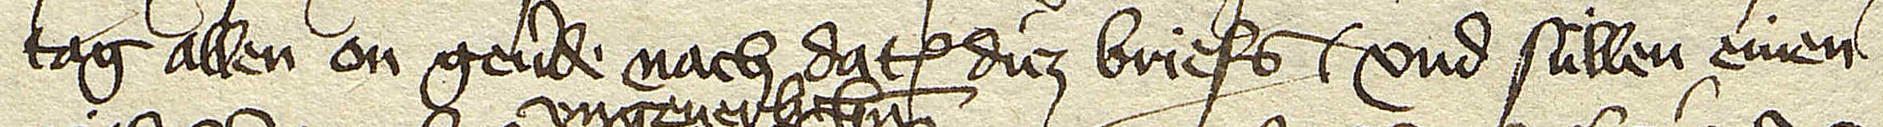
tag allen on geu*de nach dat* dicʒ briefs / vnd ſüllen einen
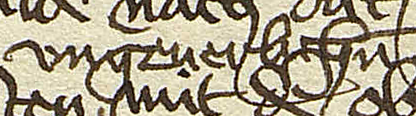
vngeuerlichn*
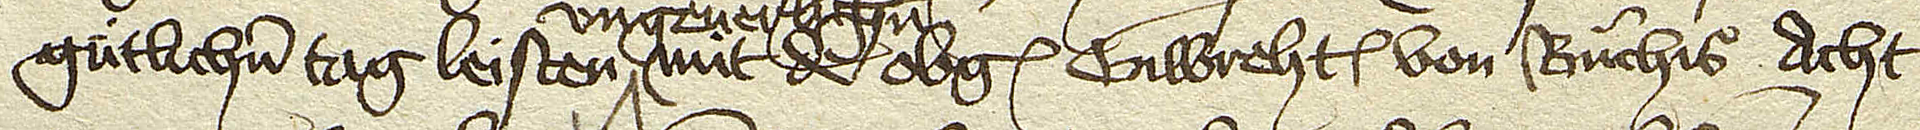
gütlichn* tag leiſten mit de* obg* Gilbrecht* von Buchis* Acht
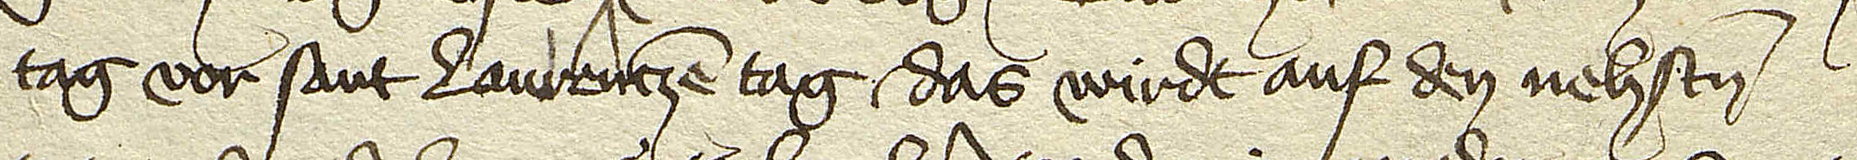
tag vor ſant Lawrencʒe* tag / das wirdt auf den nehſtn*
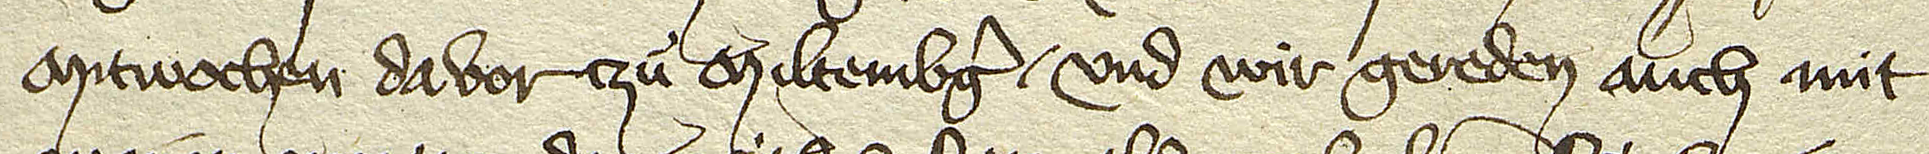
Mitwochen davor cʒü Miltembg* / vnd wir gereden auch mit
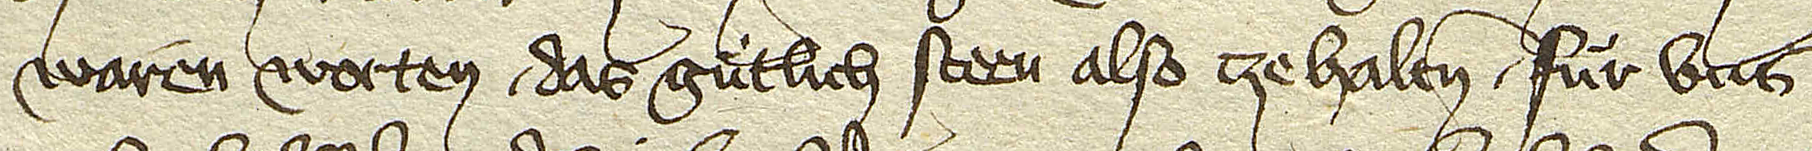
waren worten / das gütlich ſteen alſo cʒe haltn* / für vns
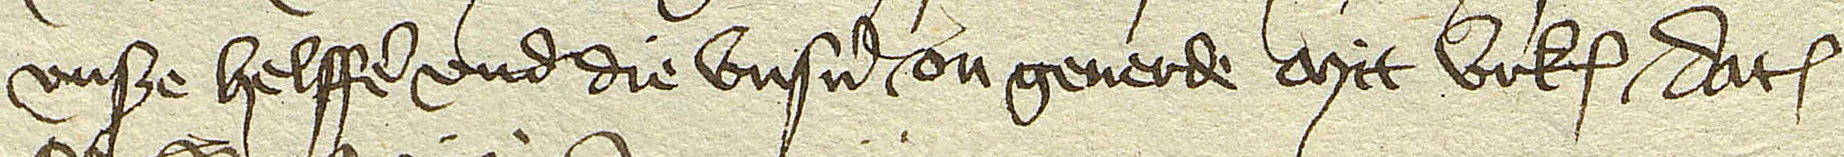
vnſ*e helffe* vnd die vnſn* / on geuerde Mit vrk* / dat*
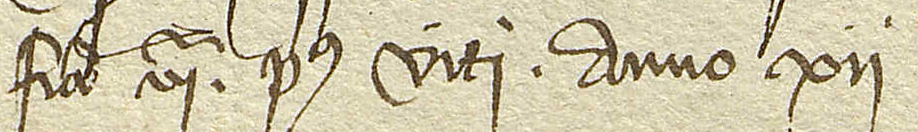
fia* vi* . p* viti . Anno xii
